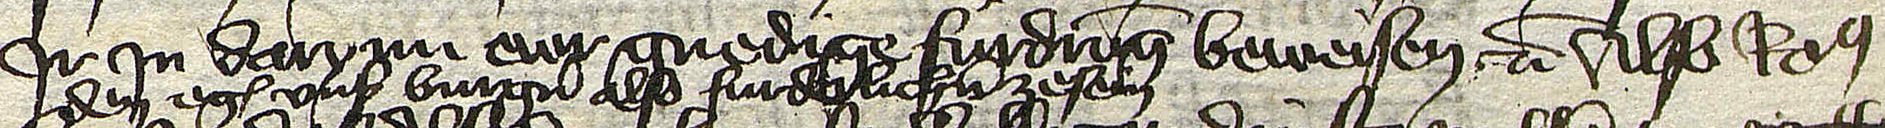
Ir In darynn ewr gnedige fürdru*g beweiſen ec* Alſo Ro*
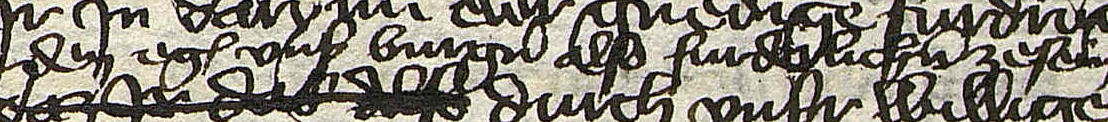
den eg* vnſ* burg*n alſo furderlich*n ʒeſein
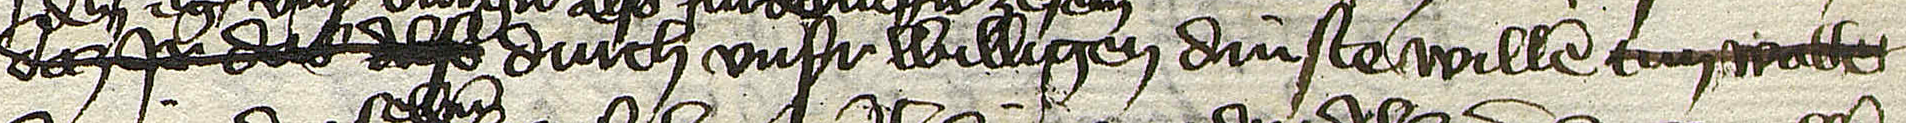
daʒ Ir das Alſo durch vnſ*r willigen dinſte wille* tun wöllet
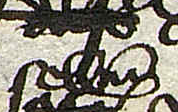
ſelb*n
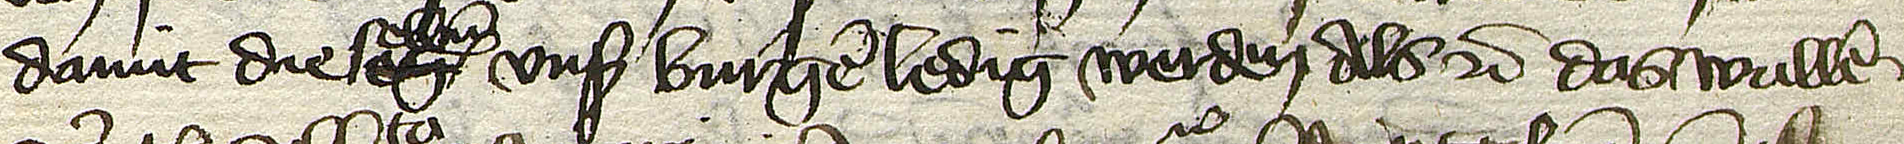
damit die eg* vnſ* burge* ledig werden Als ec* das wolle* ec*
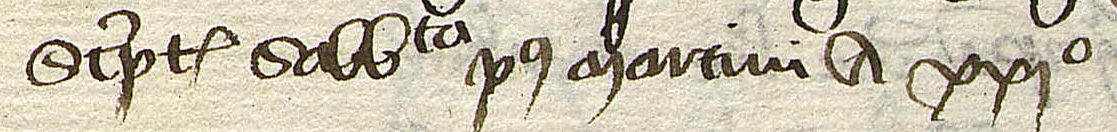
Sc*pt* Sabb* p* Martini a xxi*
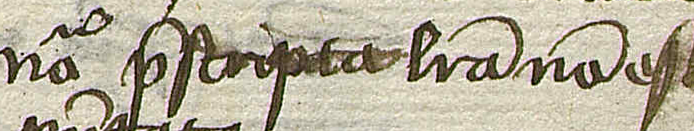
No* p*ſcripta lra* no* eſt
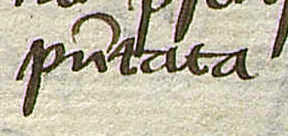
pntata*
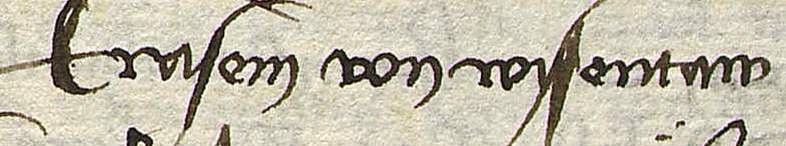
Eraſem von wyſentaw
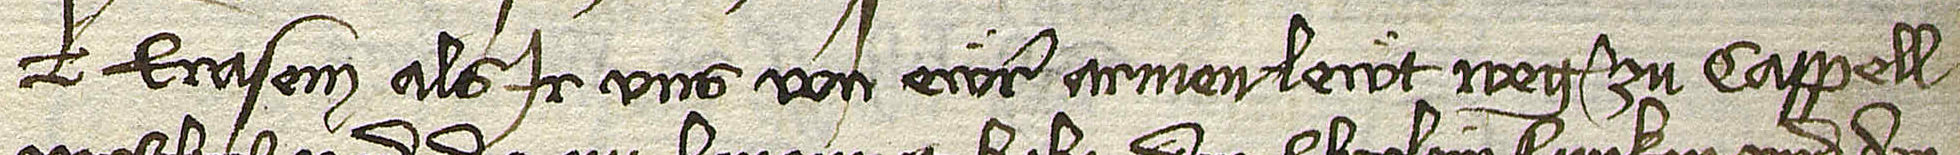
L* Eraſem als Ir vns von ew*r armen lewt weg* ʒu Cappell
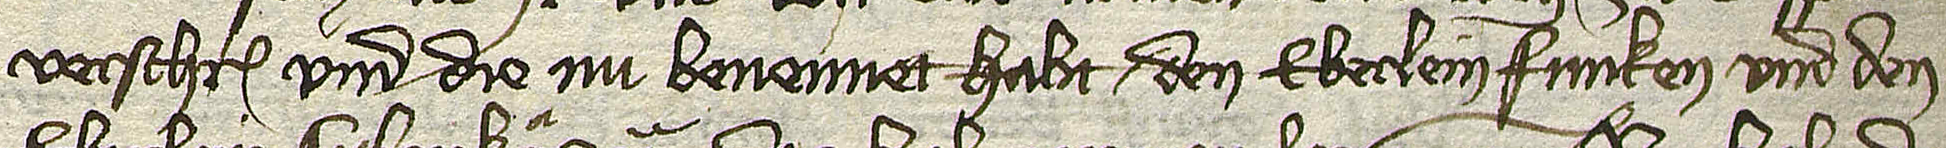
verſchr* vnd die nu benennet habt / den Eberlein funken vnd den
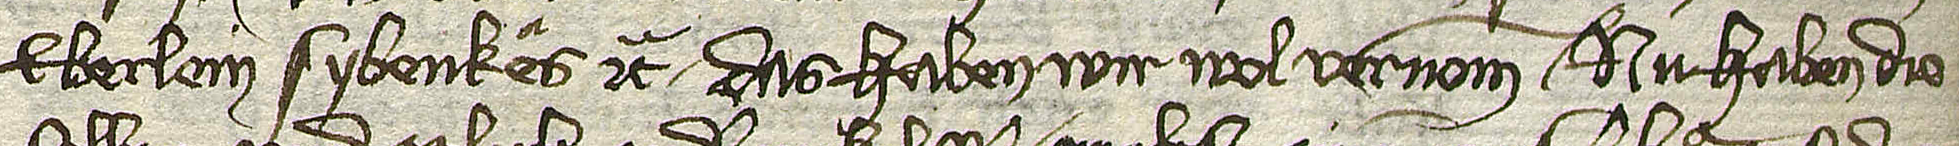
Eberlein ſybenkës ec* / Das haben wir wol vernom* / Nu haben die
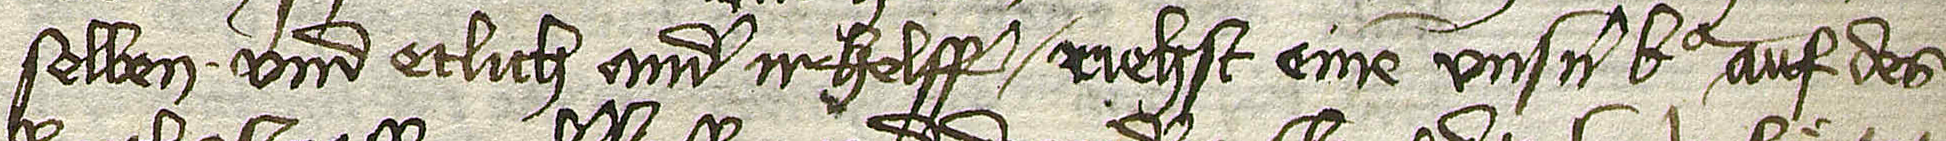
ſelben . vnd etlich and* ir helff* / nehſt eine* vnſ*n b* auf des
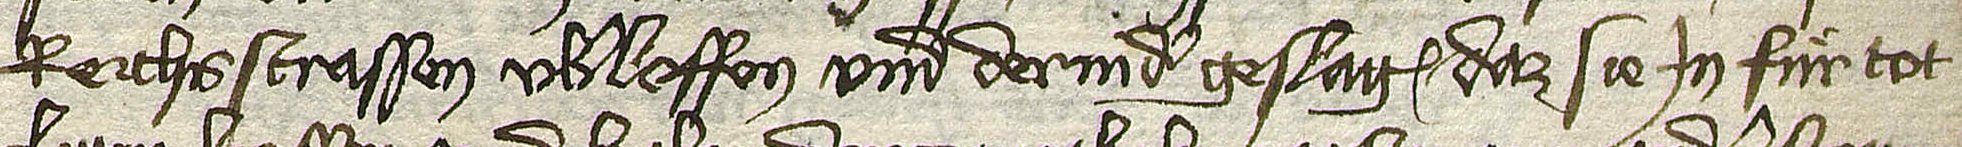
Reichs ſtraſſen vb*leffen vnd dernid* geſlag* / daʒ ſie In für tot
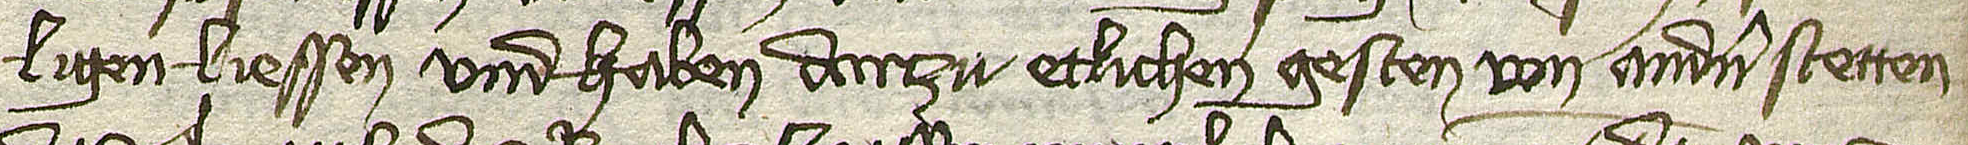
ligen lieſſen vnd haben darcʒu etlichen geſten von and*n ſtetten
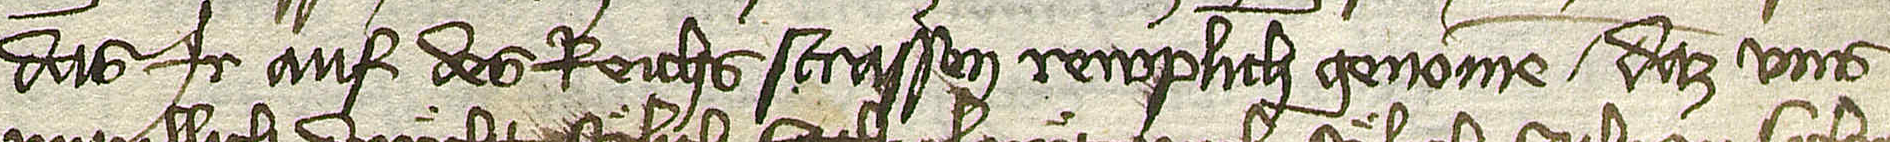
das Ir auf des Reichs ſtraſſen rewplich genome* / daʒ vns
